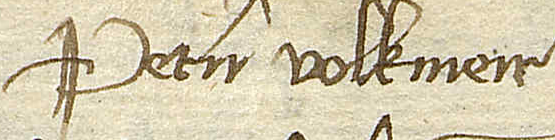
Pet*n volkmeir*
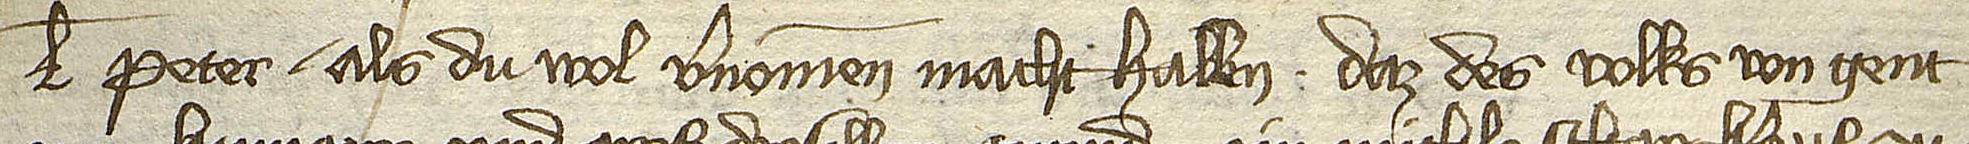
L* Peter / als du wol vnomen* macht haben . daʒ des volks von gent
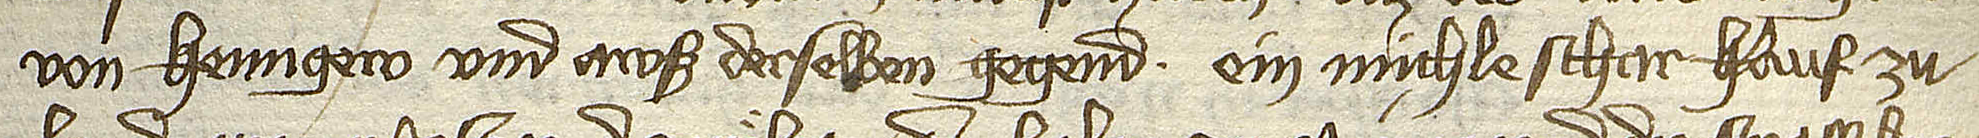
von henngew vnd awſʒ derſelben gegend . ein michle ſchar hauf* ʒu
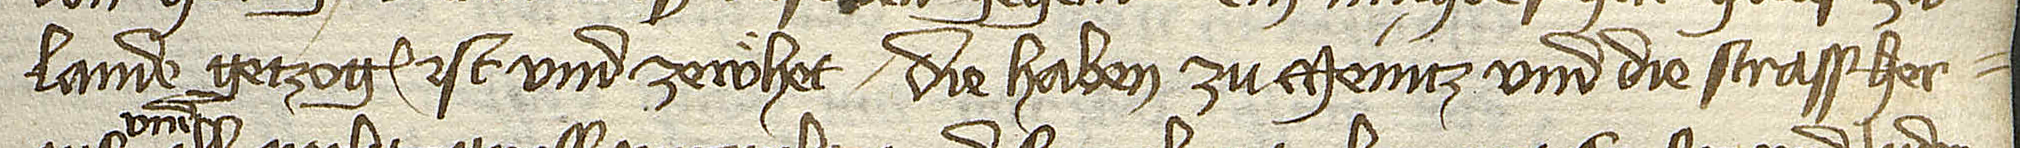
lande gecʒog* iſt vnd ʒewhet / Die haben ʒu Meincʒ vnd die ſtraſſ her =
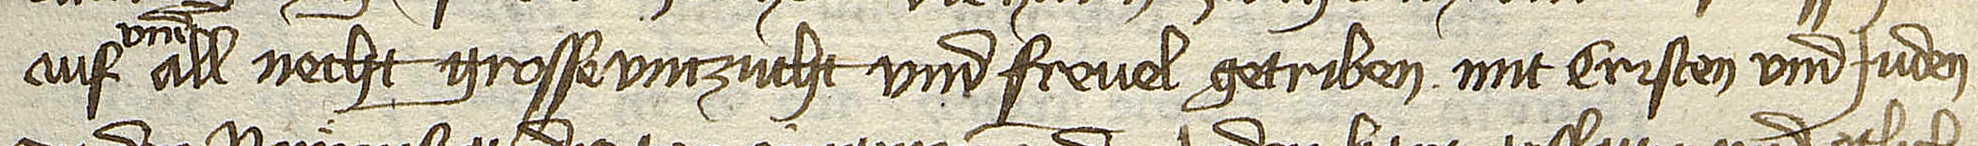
auf all necht groſſe vncʒucht vnd freuel getriben . mit Criſten vnd Iuden
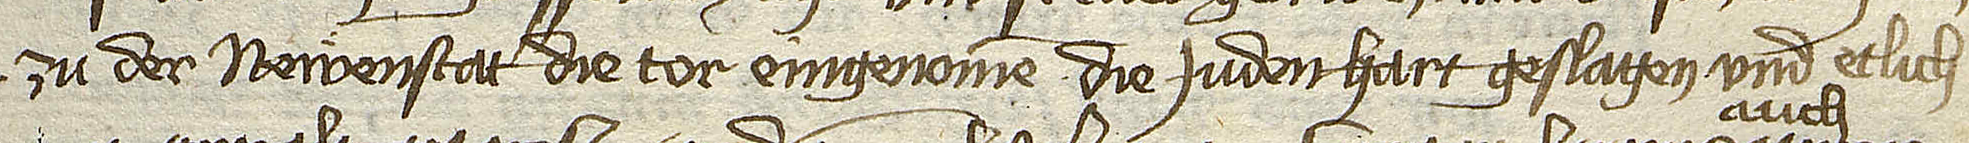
ʒu der Newenſtatt die tor eingenome* . die Iuden hart geſlagen vnd etlich
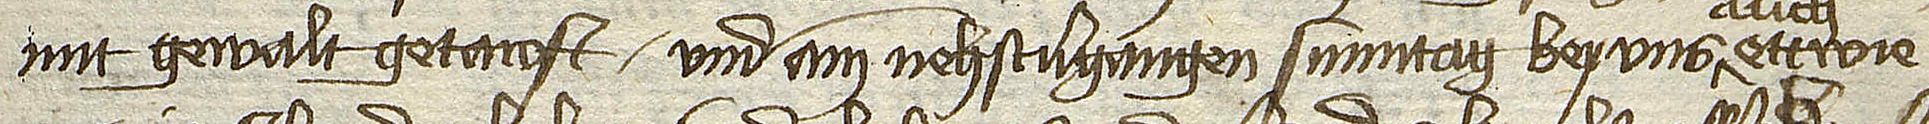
mit gewalt getawft / vnd am* nehſt u*gangen ſunntag bey vns ettwie
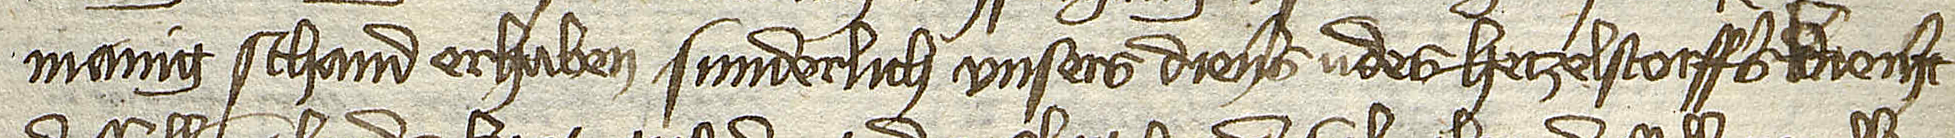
manig ſchand erhaben ſunderlich vnſers dien*s ~ des hecʒelſtorff*s kneht
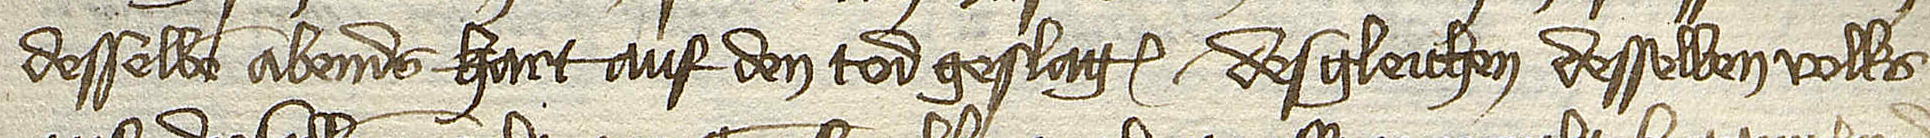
deſſelbe* abends hart auf den tod geſlag* / Deſgleichen deſſelben volks
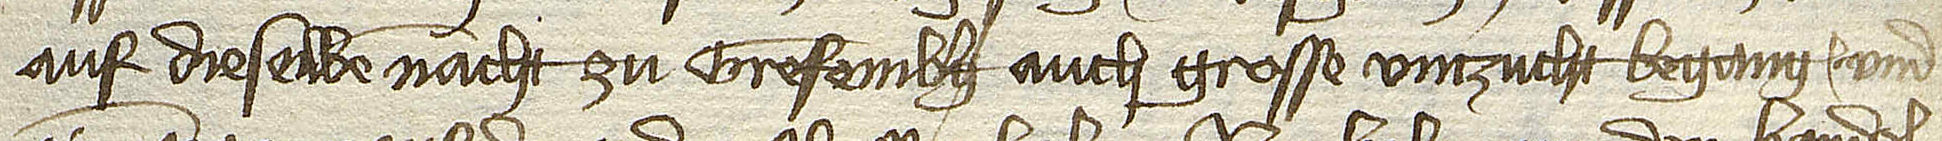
auf dieſelbe* nacht ʒu Grefembg* auch groſſe vncʒucht begang* vnd
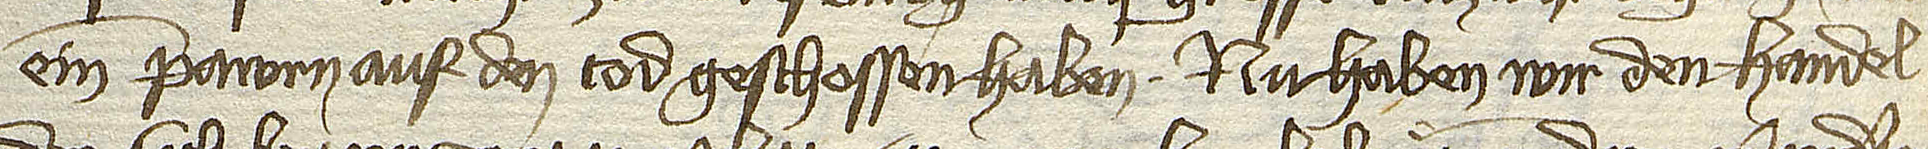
ein* Pawrn auf den tod geſchoſſen haben . Nu haben wir den handel
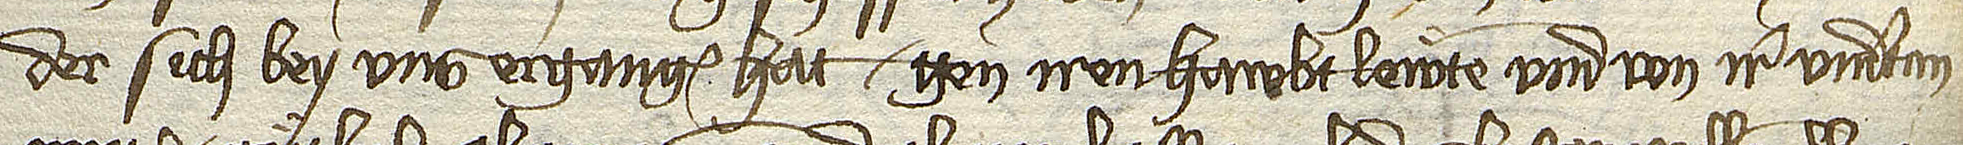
der ſich bey vns ergang* hat / gen iren hawbt lewte* vnd von ir* vnd*tan
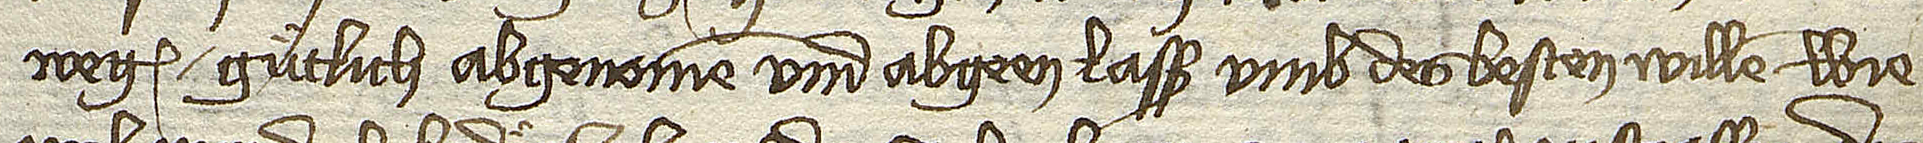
weg* / gütlich abgenome* vnd abgeen laſſ* vnd des beſten wille* Wie
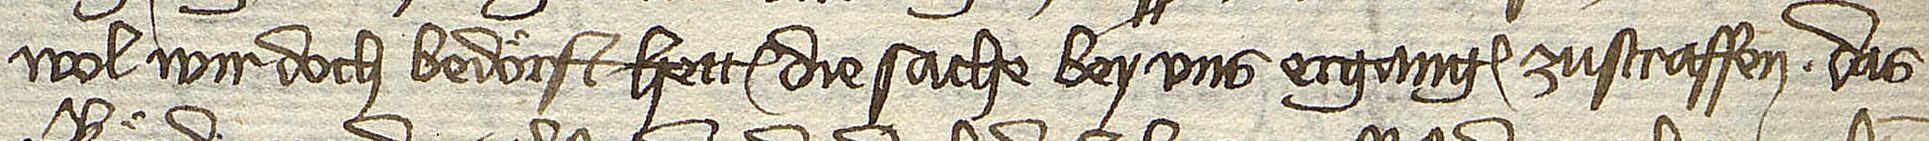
wol wir doch bedörft hett* die ſache bey vns ergang* ʒuſtraffen . Das
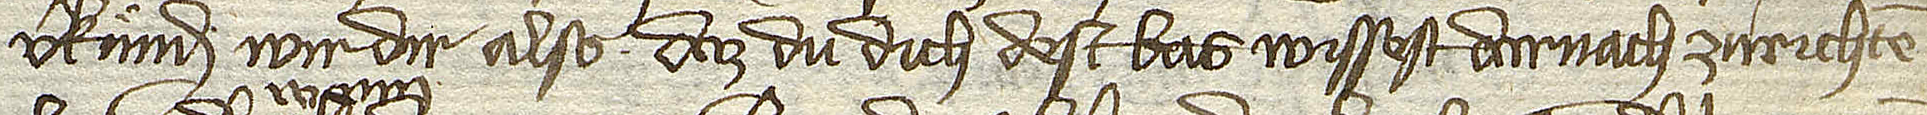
v*künd* wir dir alſo daʒ du dich deſt bas wiſſeſt darnach ʒurichte*
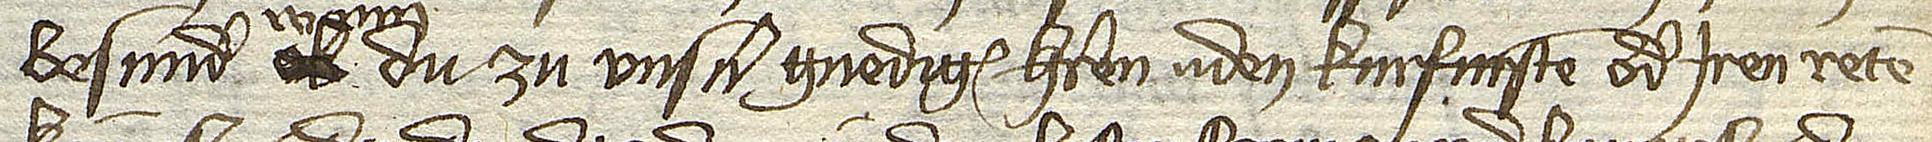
beſund* ob du ʒu vnſ*n gnedig* h*ren ~ den kurfürſte* od* Iren rete*
